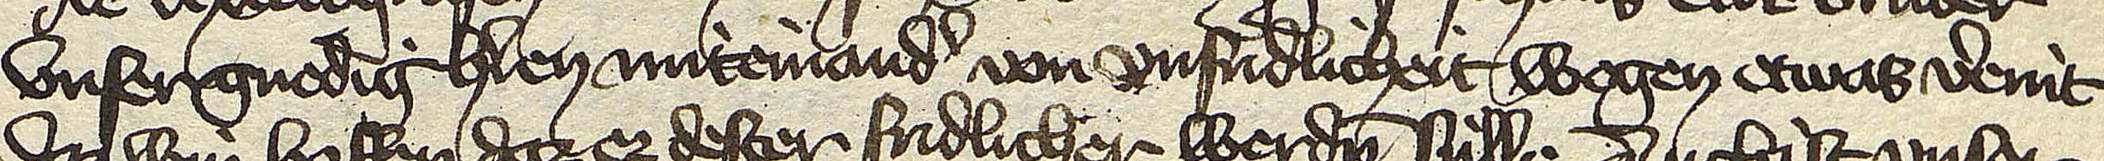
vnſer gnedig h*ren miteinand* von vnfridlicheit wegen etwas v*eint
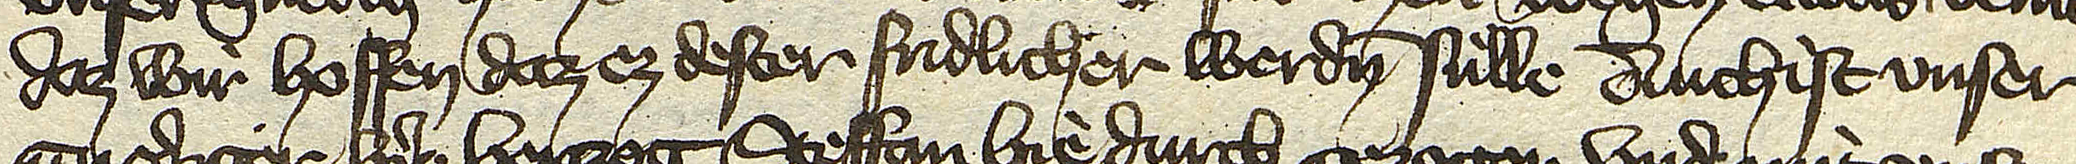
daʒ wir hoffen daʒ eʒ deſter fridlicher werdn* ſülle Auch iſt vnſer
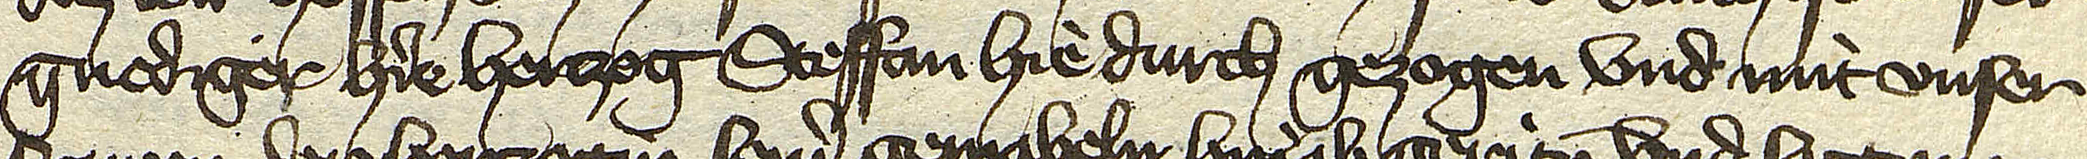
gnediger h*re hercʒog Steffan hie durch geʒogen vnd mit vnſer
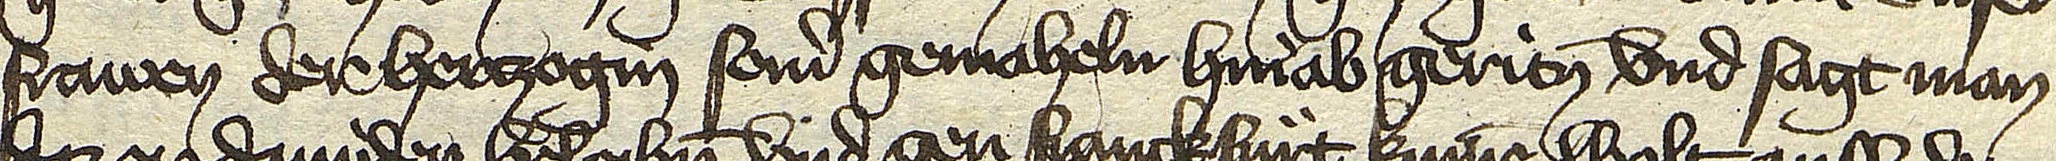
frawen der hercʒogin ſein* gemaheln hinab geritn* vnd ſagt man
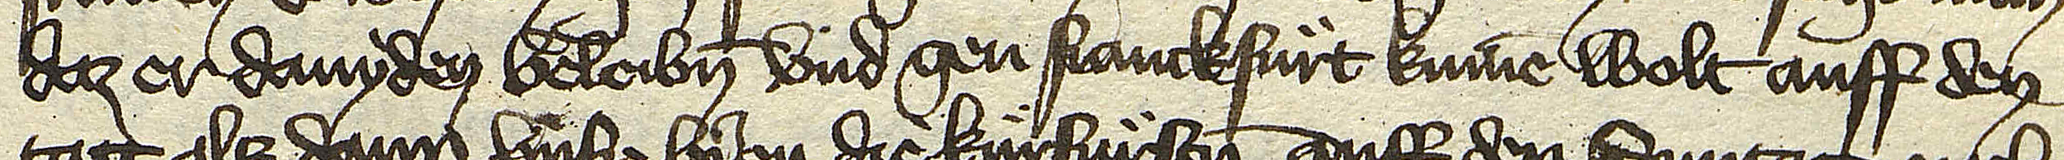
daʒ er danyden beleibn* vnd gen franckfürt kume* wolt auff den
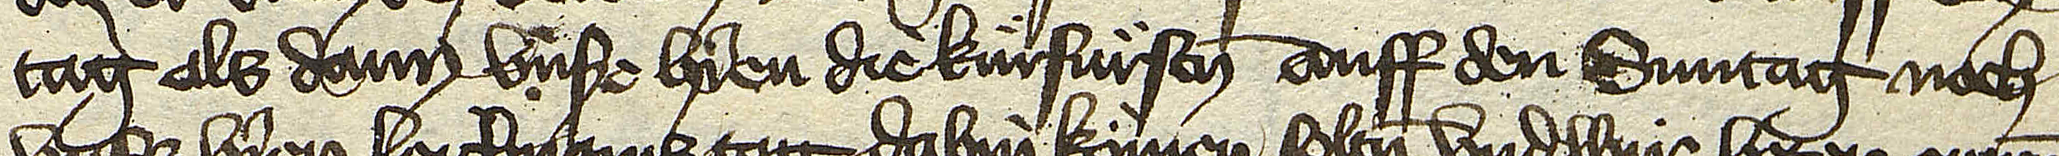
tag als dann vnſ*e hr*en die kürfürſtn* auff den Suntag nach
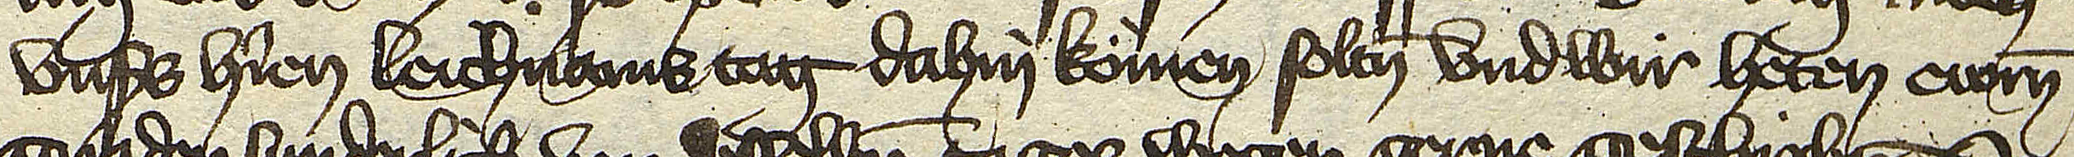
vnſ*s hr*en leichnams tag dahin kömen ſoltn* vnd wir heten ewrn*
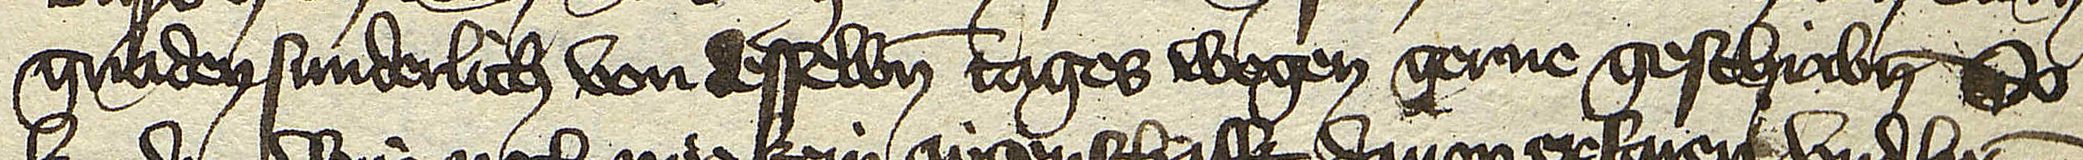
gnaden ſunderlich von deſſelbn* tages wegen gerne geſchribn* So
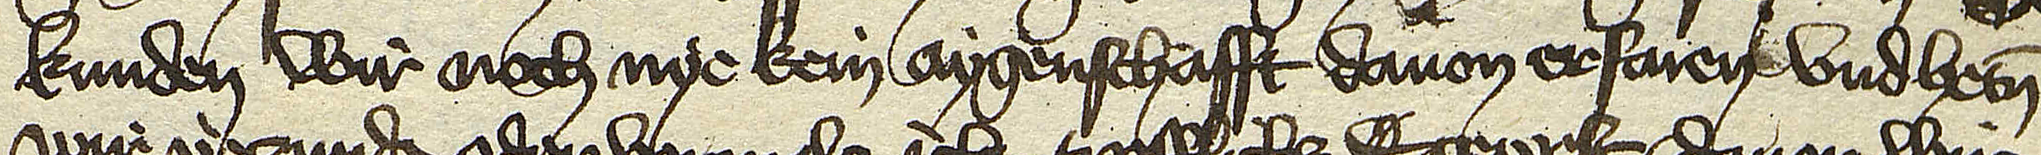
kunden wir noch nye kein aygenſchafft dauon erfaren vnd hetn*
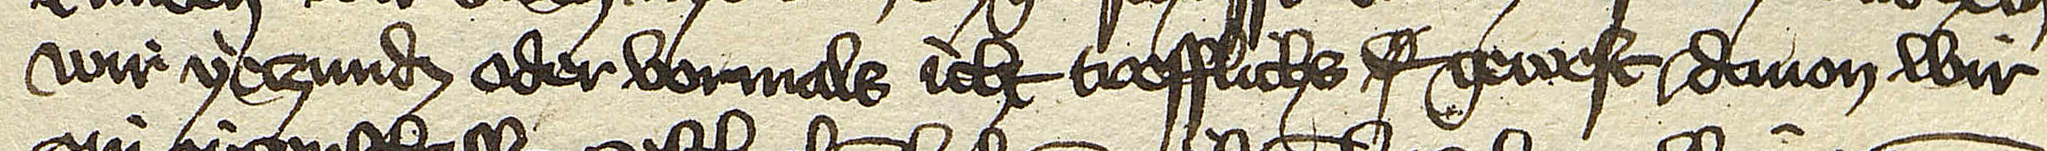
wir yecʒund* oder vormals icht trefflichs geweſt / dauon wir
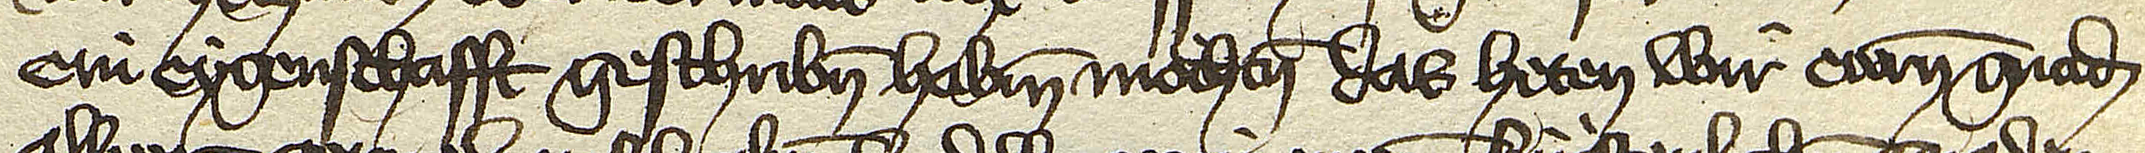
ein eygenſchafft geſchribn* habn* möchtn* das heten wir ewrn* gnad*
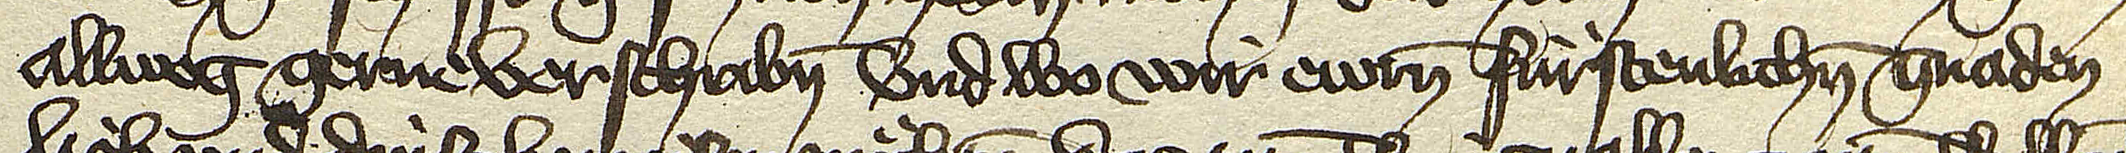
allweg gerne verſchribn* vnd wo wir ewrn* fürſtenlichn* gnaden
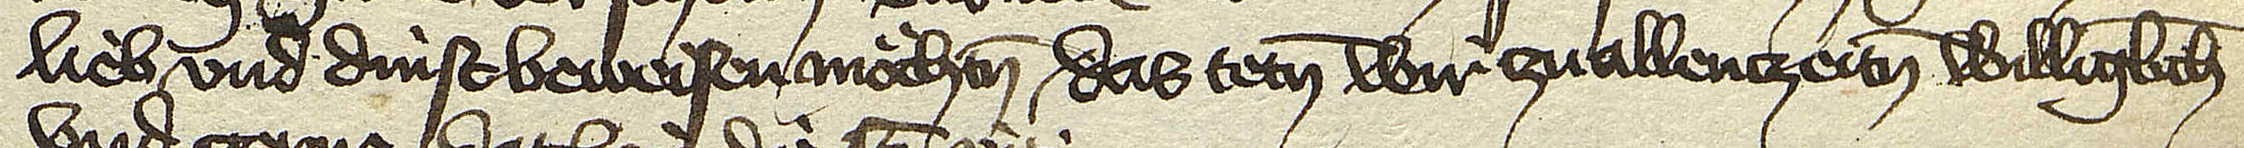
lieb vnd dienſt beweiſen möchtn* / das tetn* wir cʒu allencʒeitn* williglich*
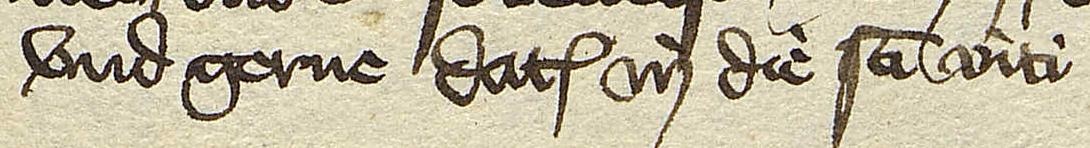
vnd gerne dat* in die ſci* viti
